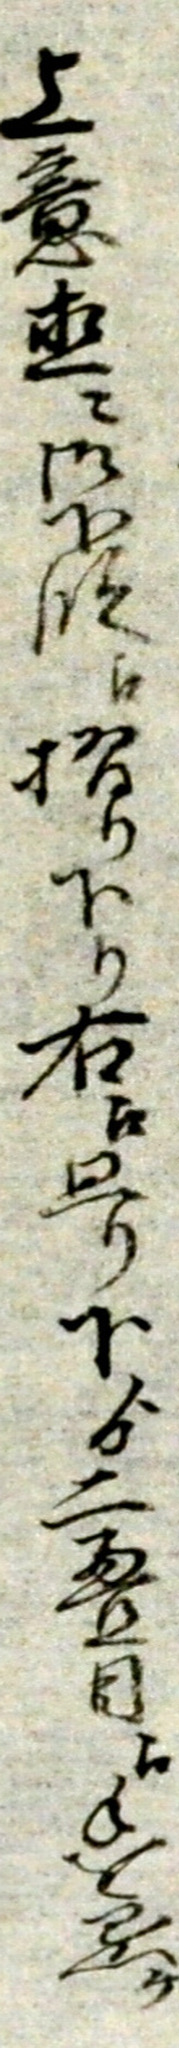上意直二御下段江摺り下り右江廻り下ゟ二畳目江手を懸ケ
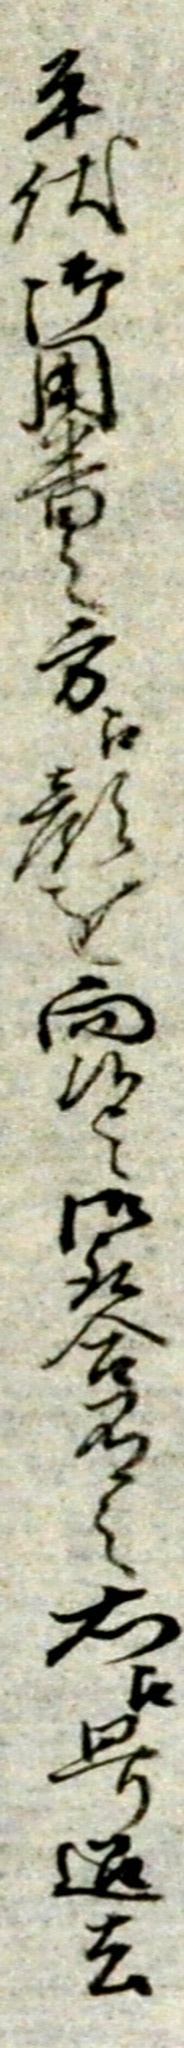平伏御用番之方江顔を向候と御取合有之右江廻り退去
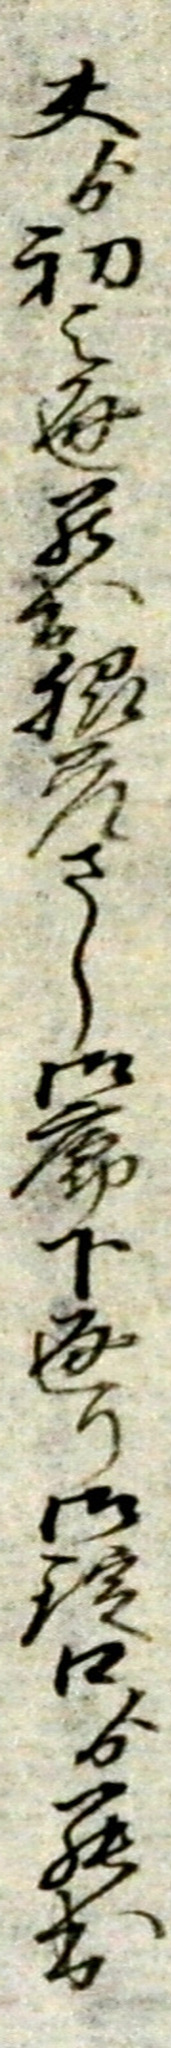夫ゟ初之通罷出脇差さし御廊下通り御錠口ゟ罷出
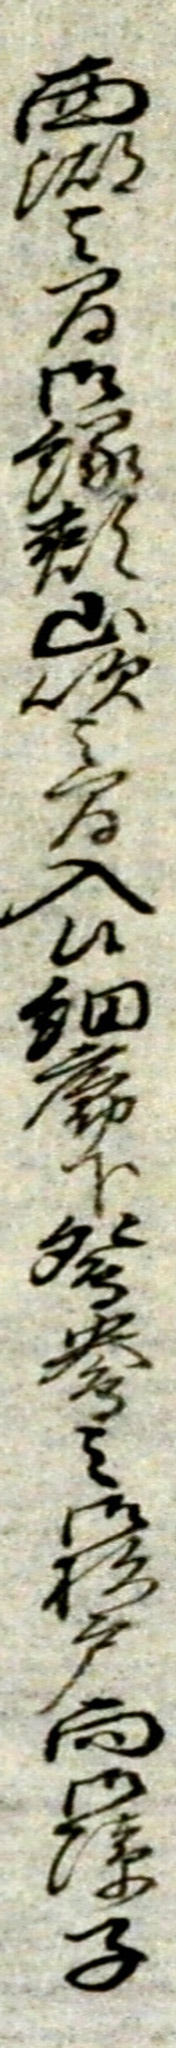西湖之間御縁頬山吹之間入候細廊下鴛鴦之御杉戸向御障子
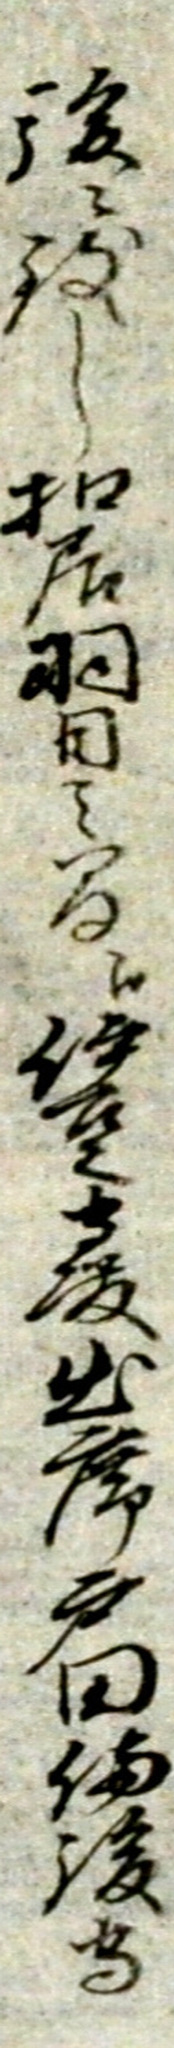後二致し扣居羽目之間江伊豆守殿出席戸田備後守
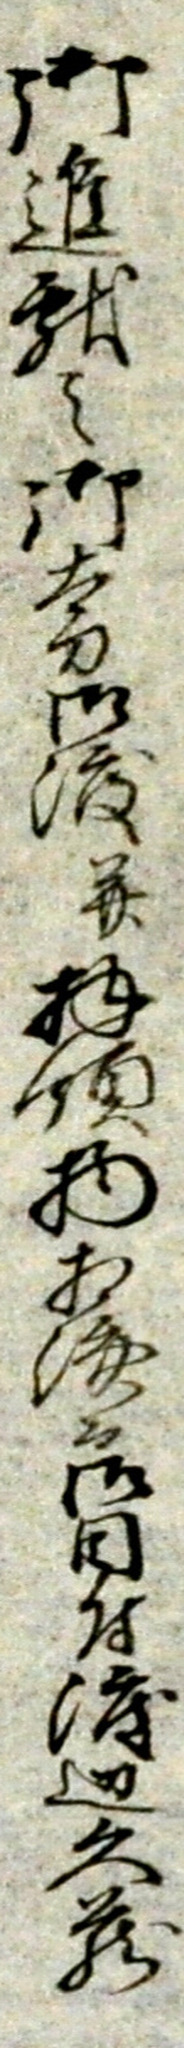御進献之御太刀御渡幷拝領物相済而御目付渡辺久蔵
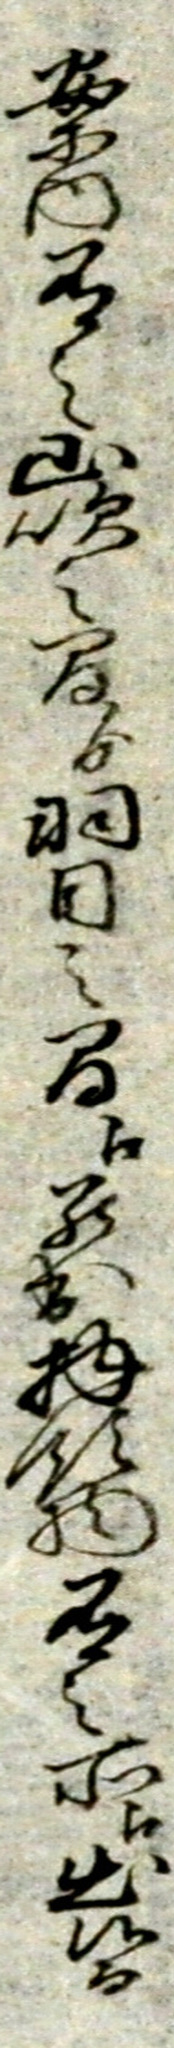案内有之山吹之間ゟ羽目之間江罷出拝領物有之所江出候而
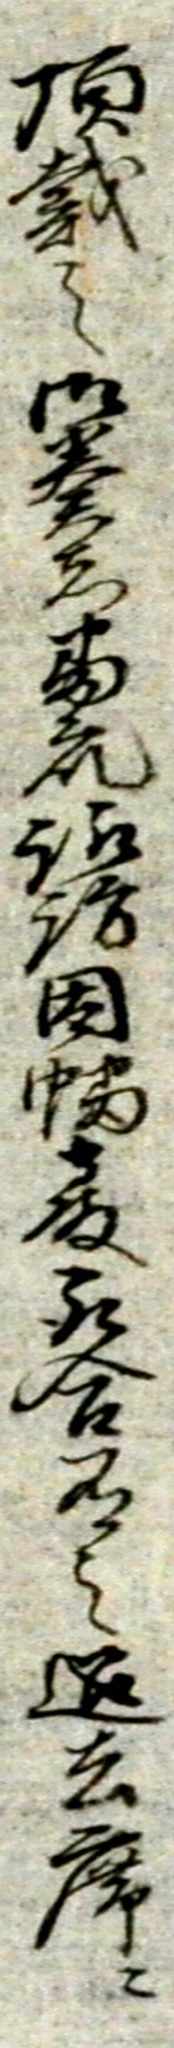頂戴之御奏番衆諏訪因幡守殿取合有之退去席ニ
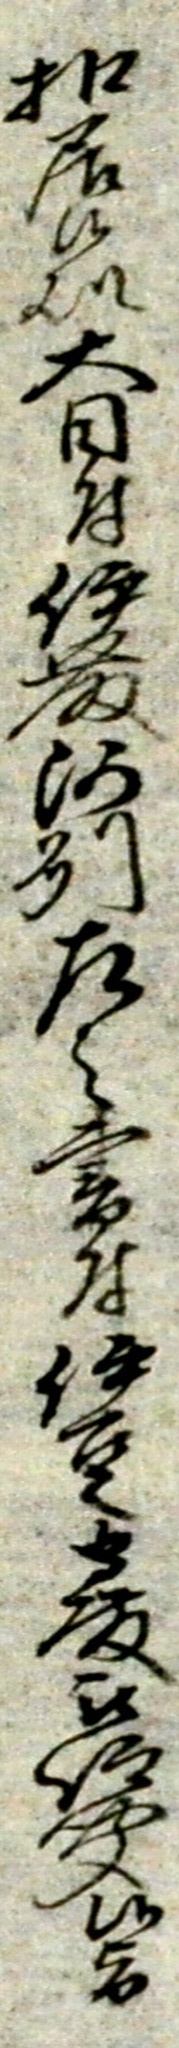扣居候処大目付伊藤河州左之書付伊豆守殿被仰聞候旨
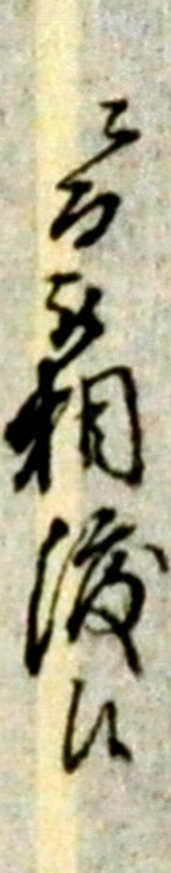二而被相渡候
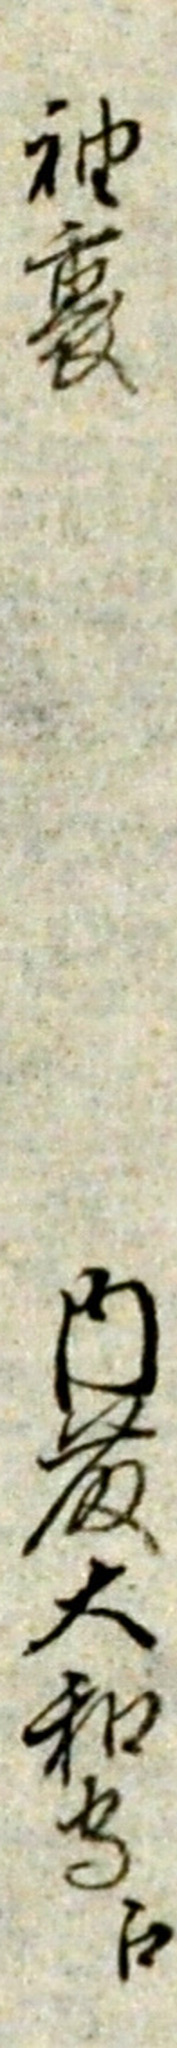袖裏内藤大和守江
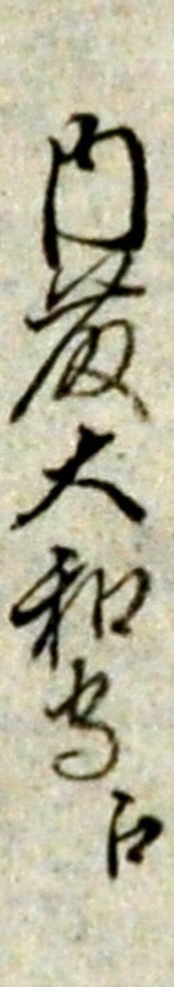内藤大和守
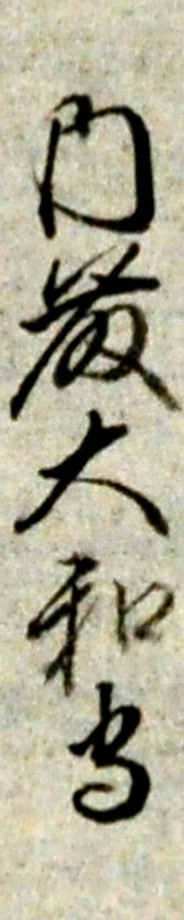内藤大和守
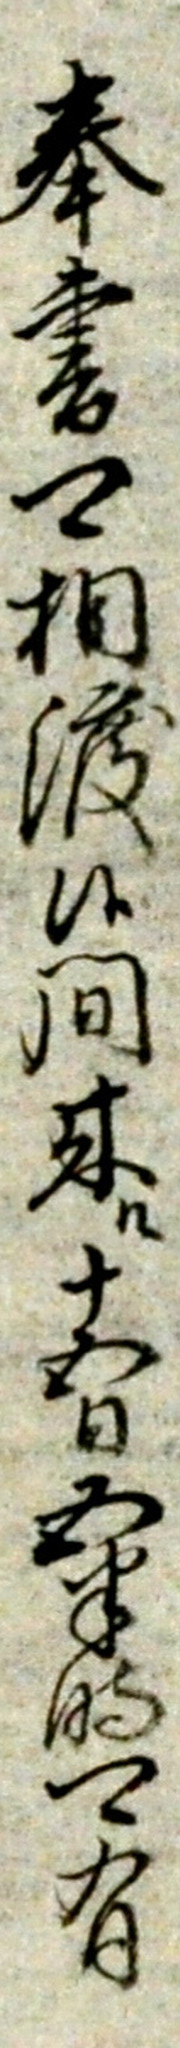奉書可相渡候間來ㇽ十五日五半時可有
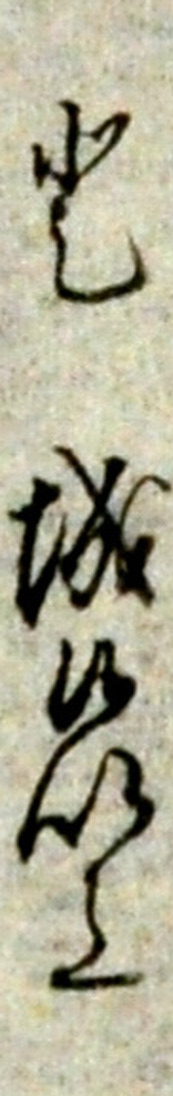登城候以上
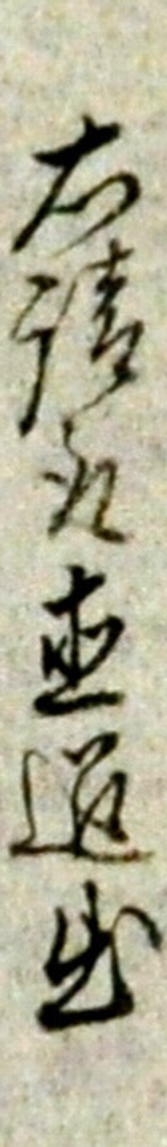右請取直退出
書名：日光御名代相勤候節ノ留
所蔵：伊那市立高遠町図書館・合同会社AMANE
